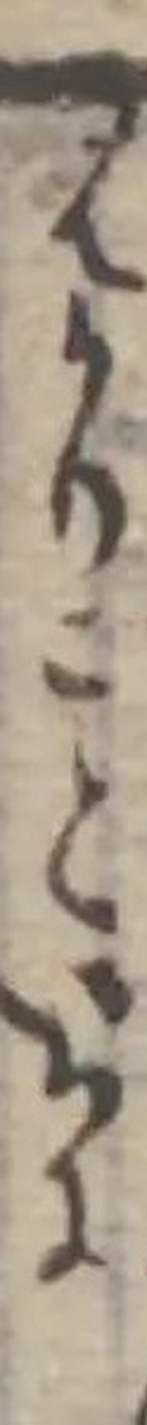はかりこといかに
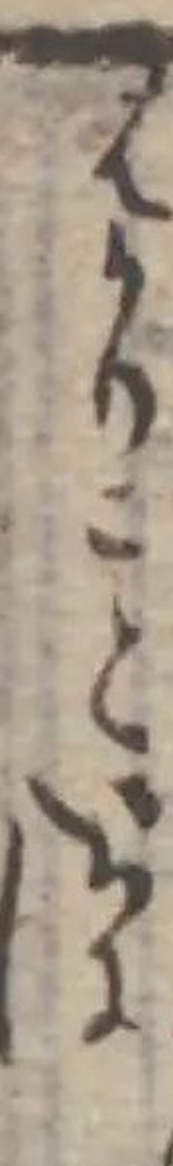はかりこといかに
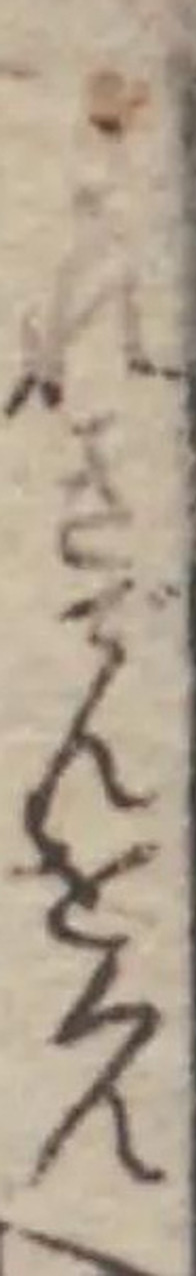これきでんをくん
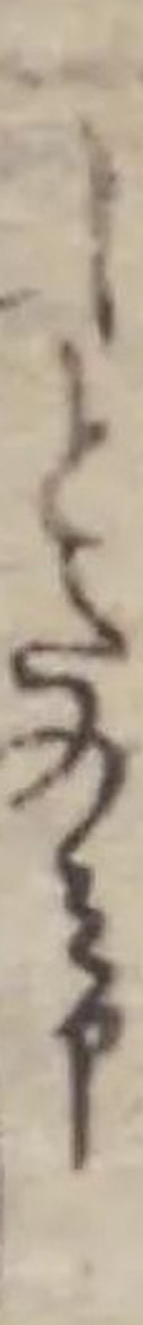しとたのみ申
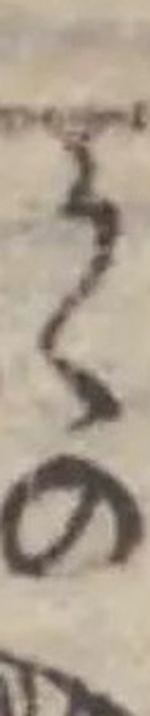かくの
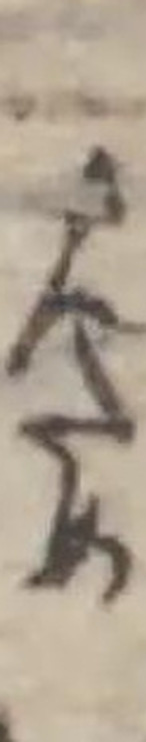さんため
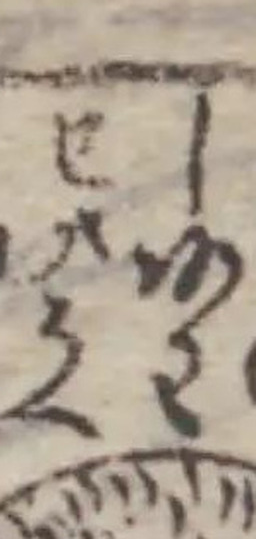せ此うへ
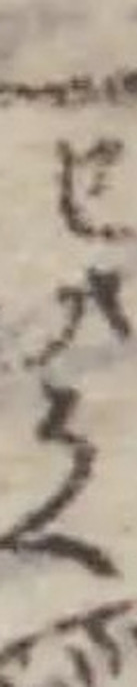せ此うへ
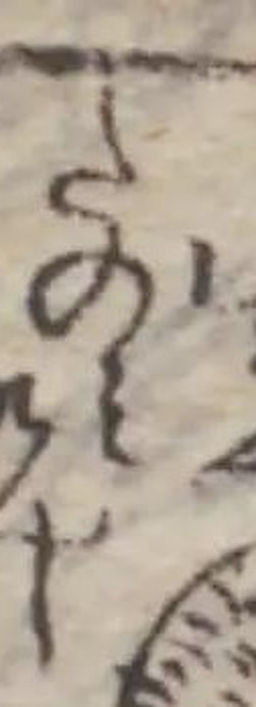たのみ
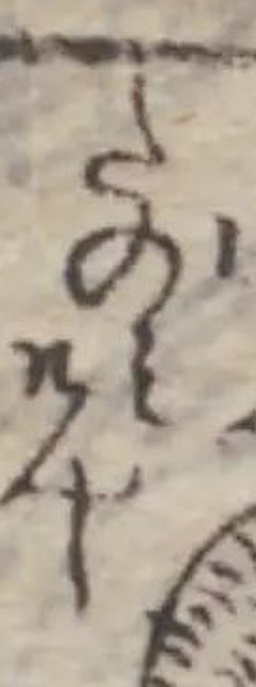たのみ
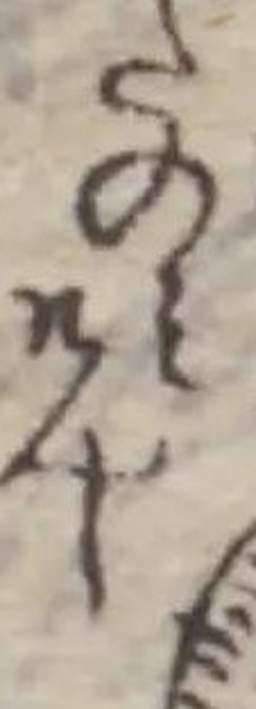けんし
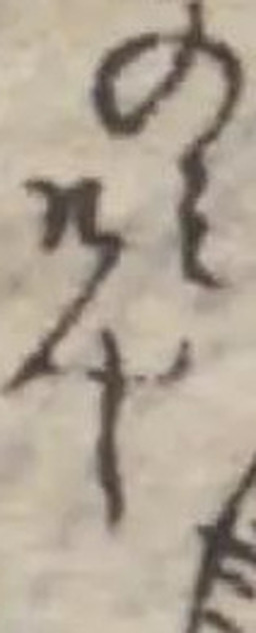けんし
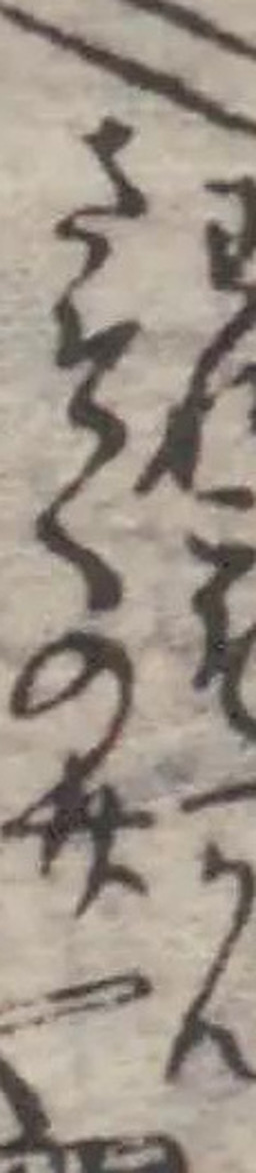さそくの介か
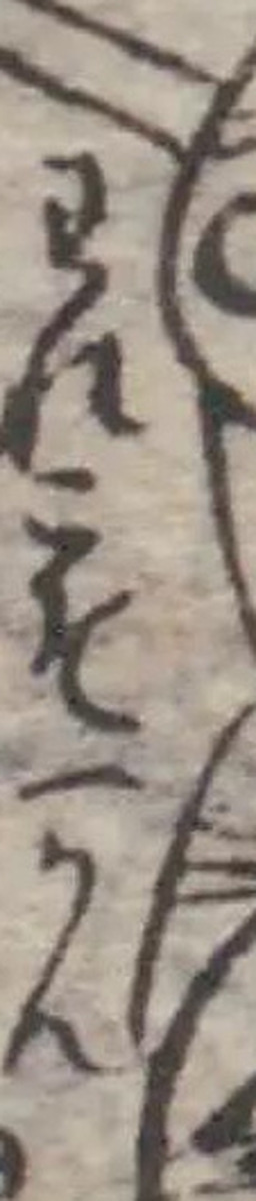われこそ一かん
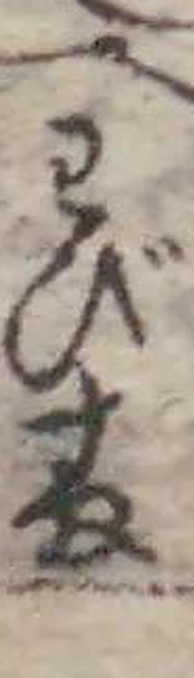わびすま
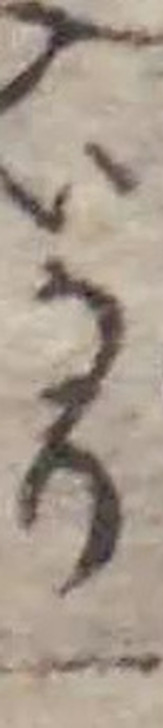いなり
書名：化物三ツ目大ほうい 2巻
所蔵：国立国会図書館 National Diet Library, JAPAN
